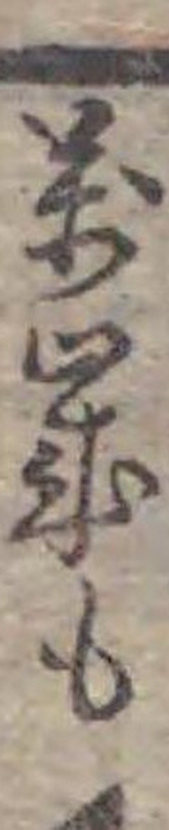万歳も
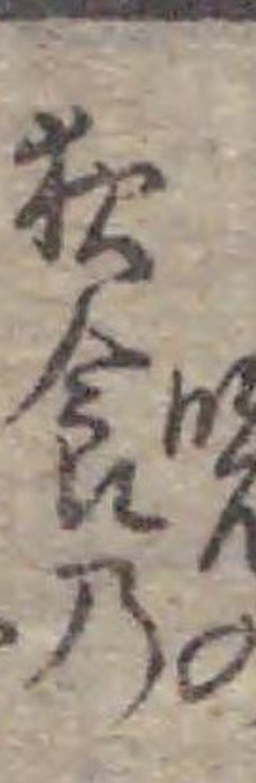夜食の
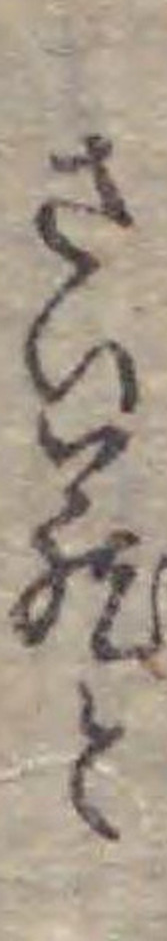さい蔵と
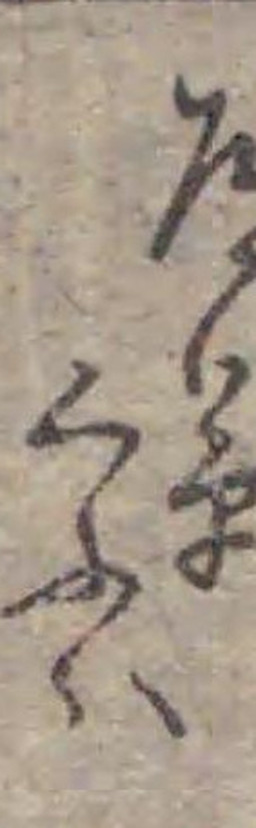くふは
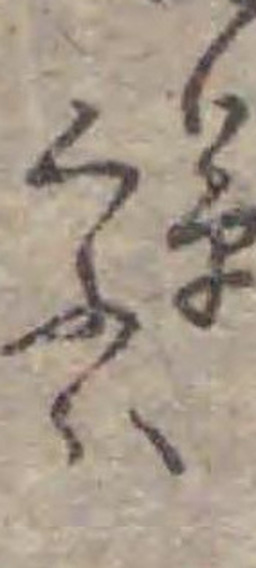くふは
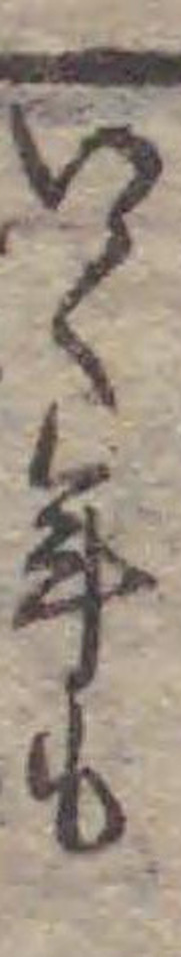いく年も
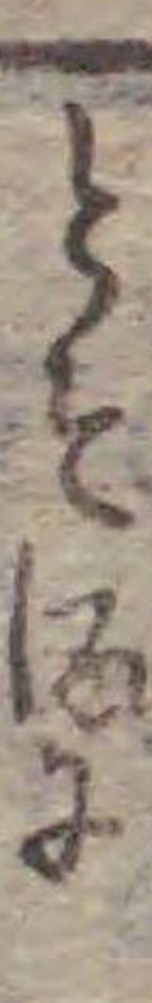とそ酒に
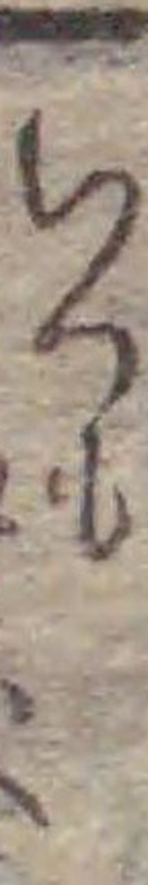いつも
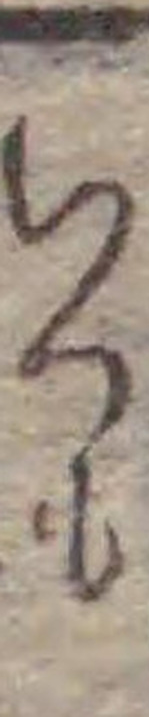いつも
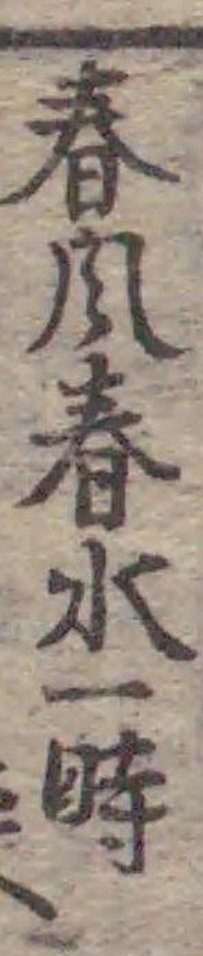春風春水一時
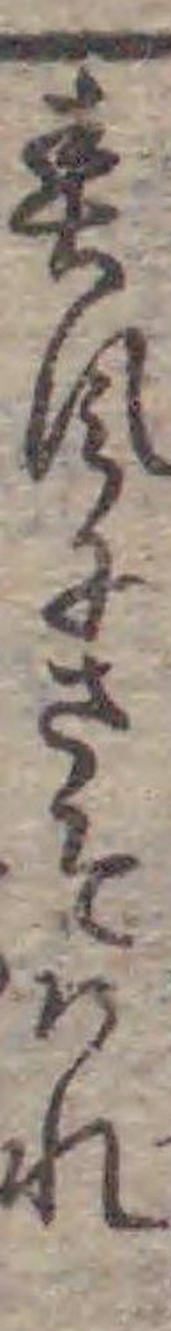春風にさそはれ
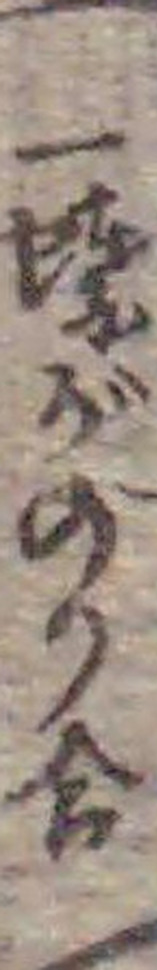一蝶がのり合
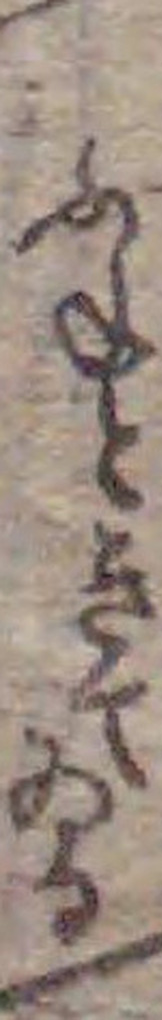ふねときてゐる
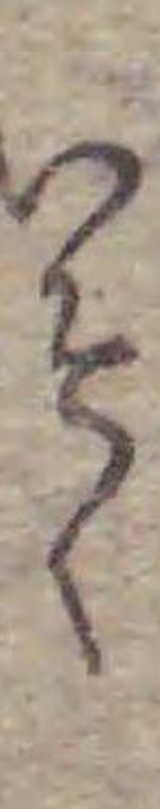いそく
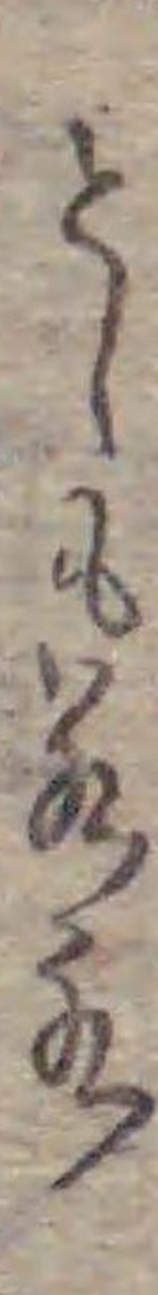としも若水
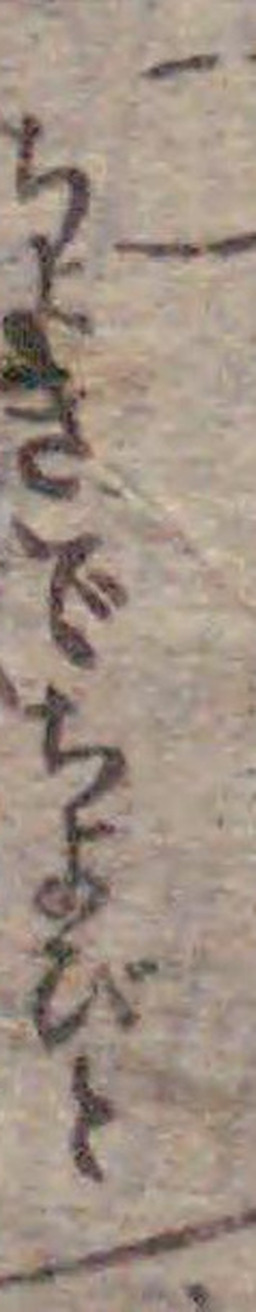ちよきでちよびと
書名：年始御礼帳 : 3巻
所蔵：国立国会図書館 National Diet Library, JAPAN
